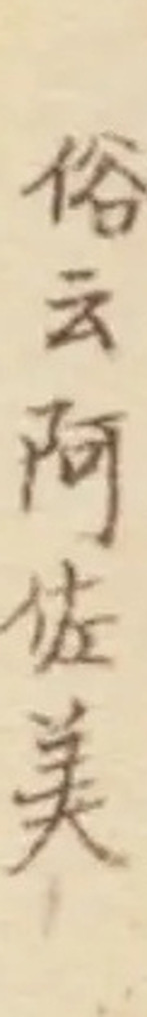俗云阿佐美
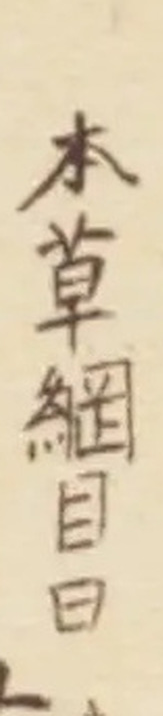本草綱目曰
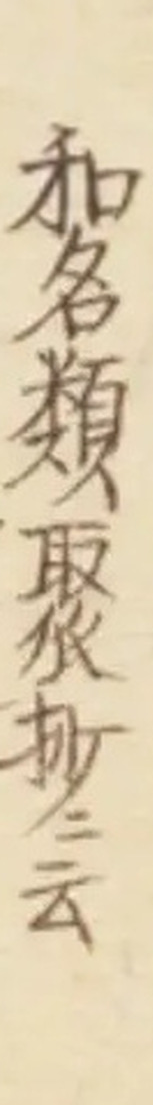和名類聚抄に云
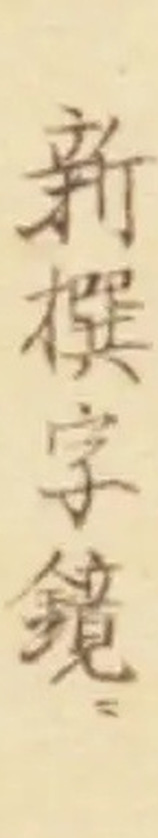新撰字鏡に
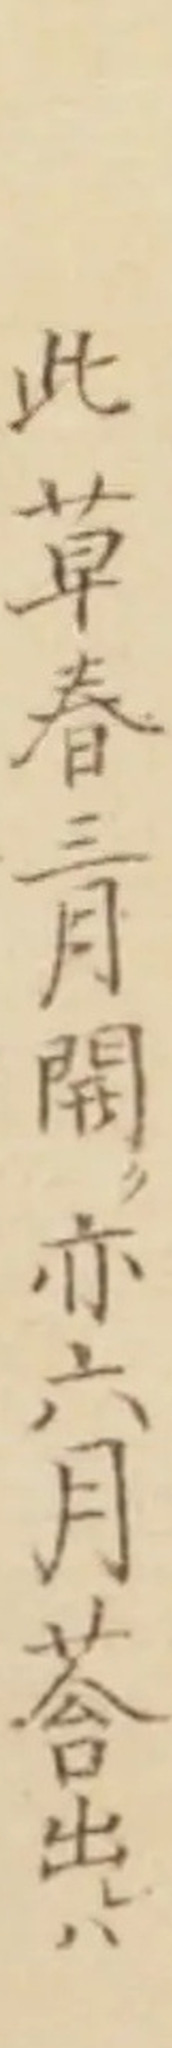此の草春三月開く亦六月莟出れば
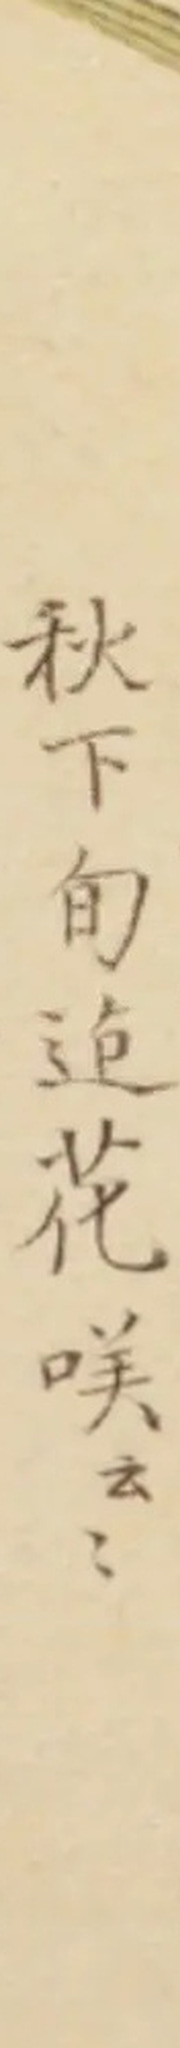秋下旬連花咲云々
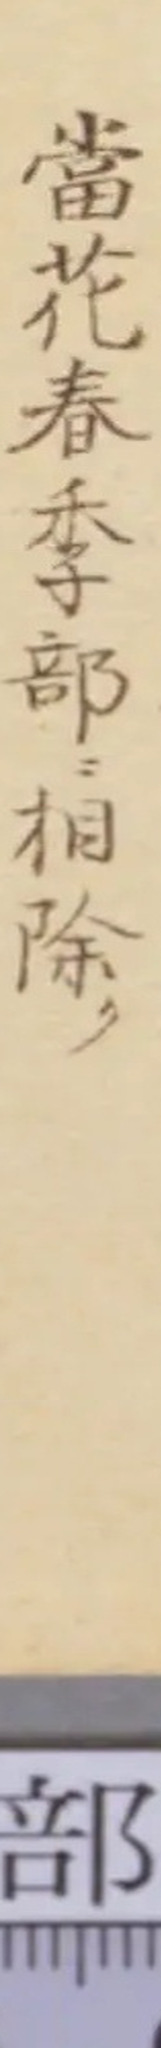當花春季部に相除く
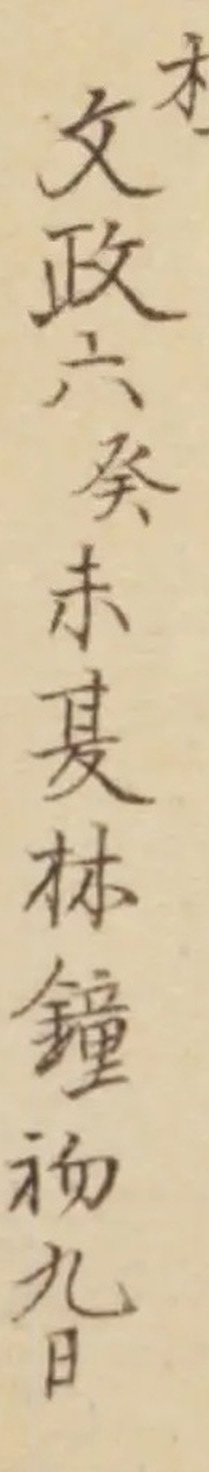文政六癸未夏林鐘霖初九日

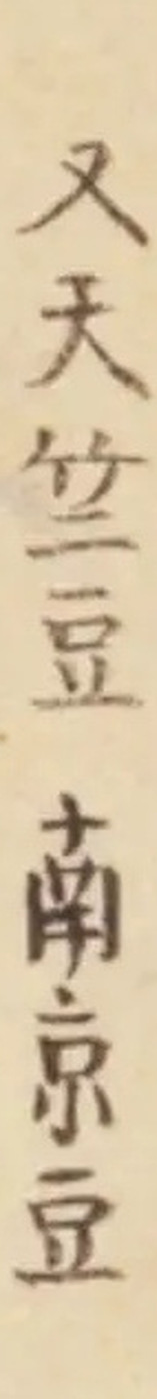又天竺豆南京豆
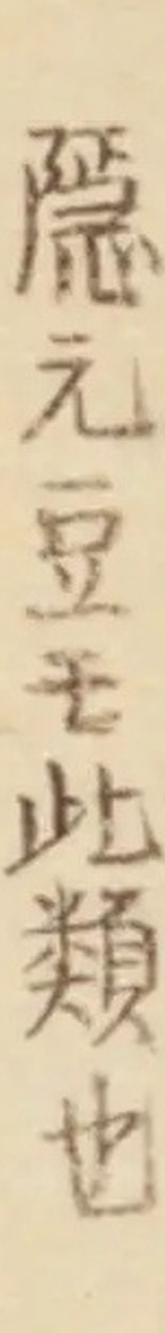隠元豆モ此類也
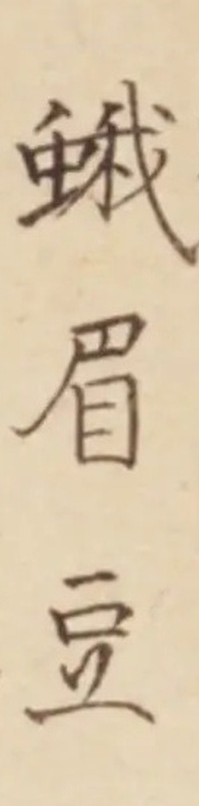蛾眉豆
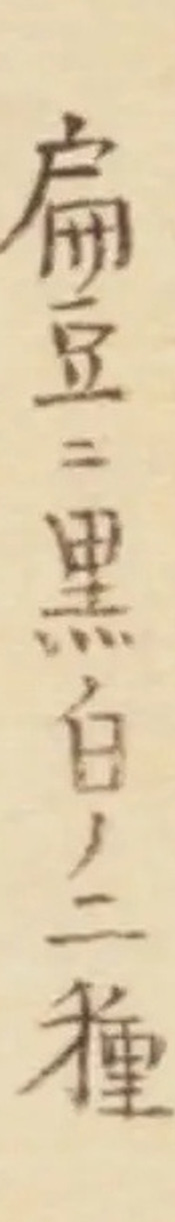扁豆ニ黒白ノ二種
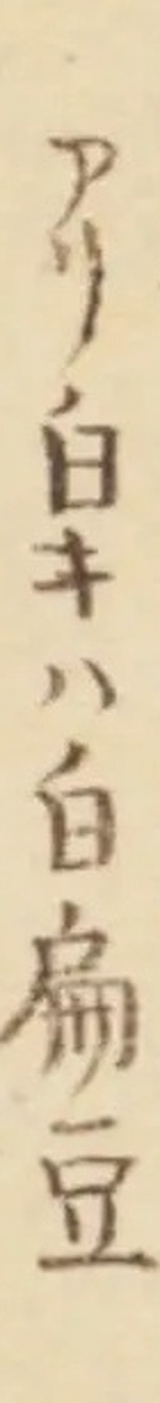アリ白キハ白扁豆
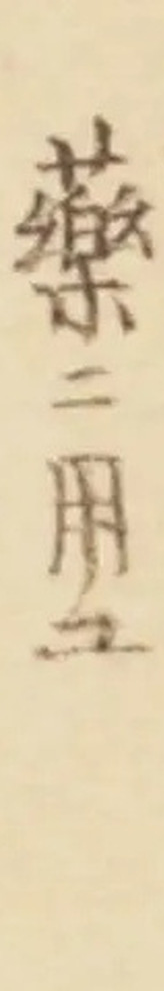藥ニ用ユ
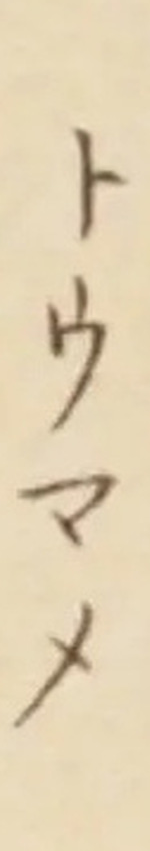トウマメ
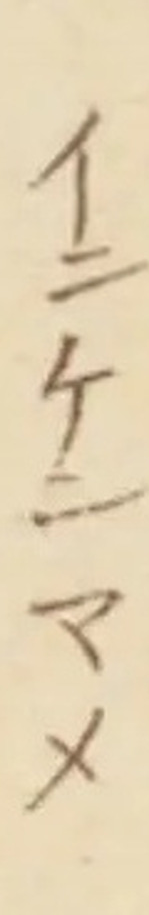インケンマメ
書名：梅園草木花譜夏之部. 2
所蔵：国立国会図書館 National Diet Library, JAPAN
